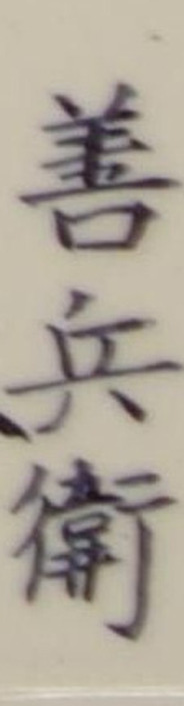善兵衛
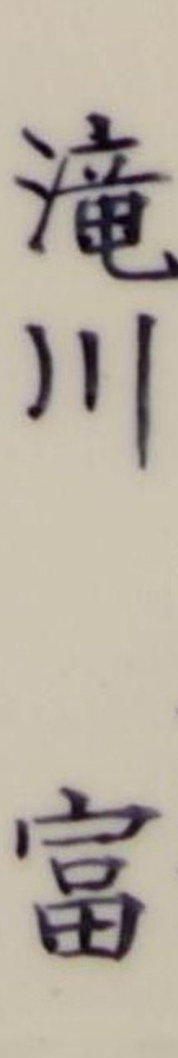滝川富
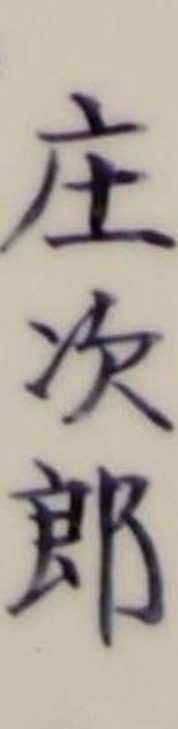庄次郎
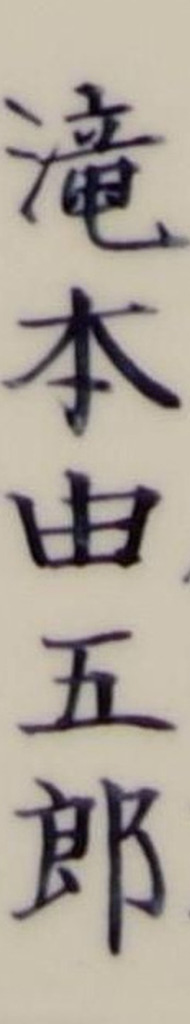滝本由五郎
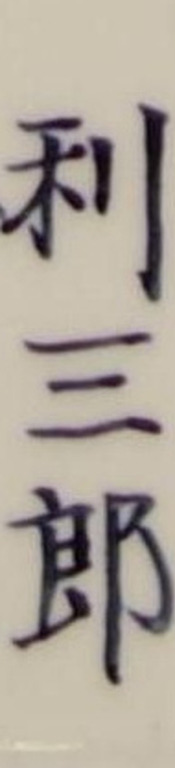利三郎
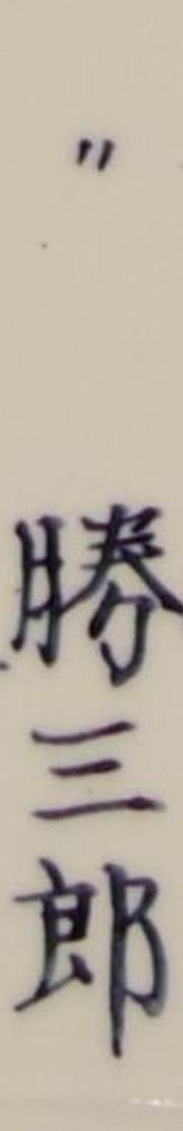勝三郎
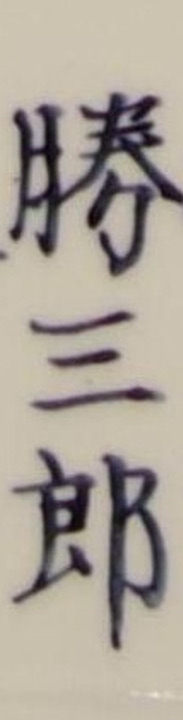勝三郎
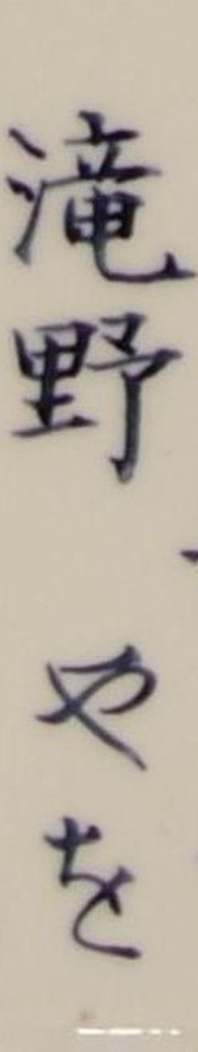滝野やを
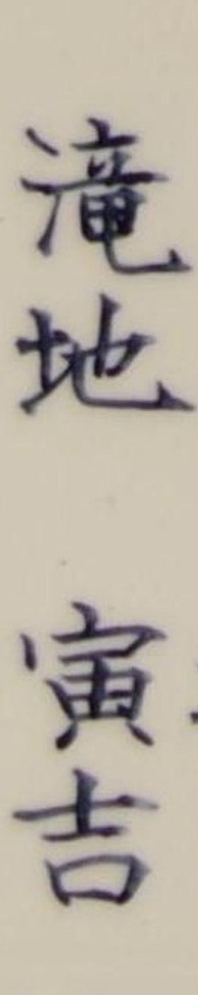滝地寅吉
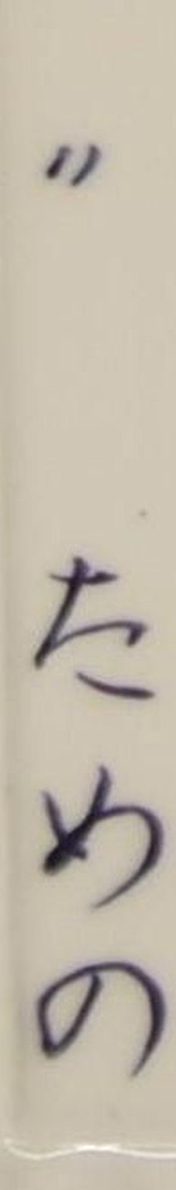ための
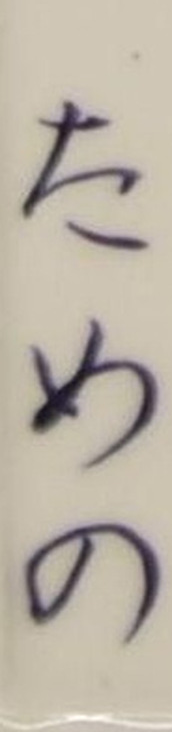ための

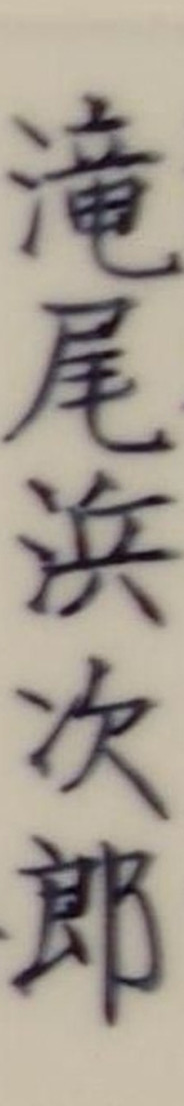滝尾浜次郎
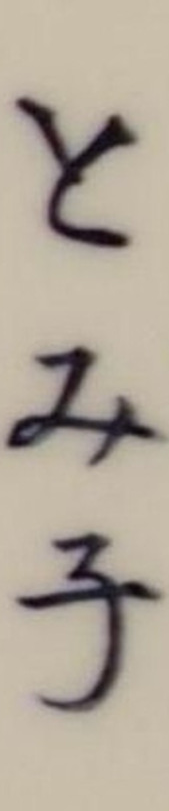とみ子
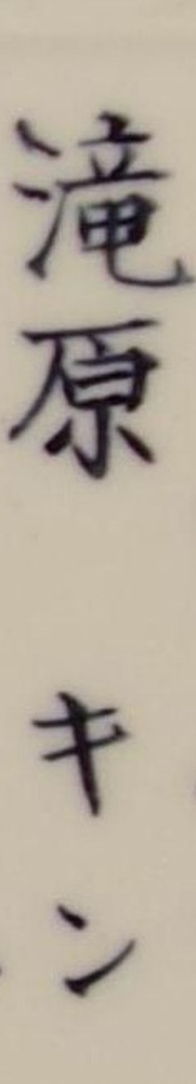滝原キン
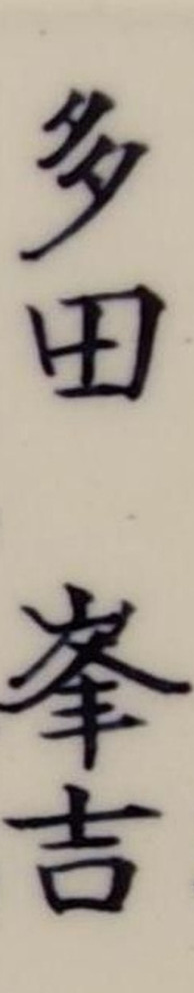多田峯吉
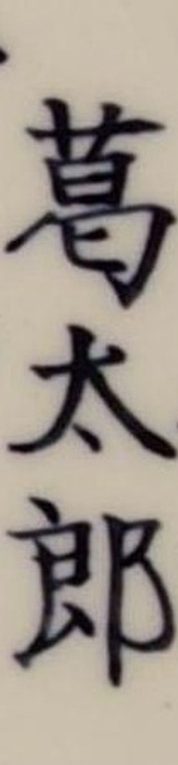葛太郎
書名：E~L
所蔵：高野山金剛峯寺
